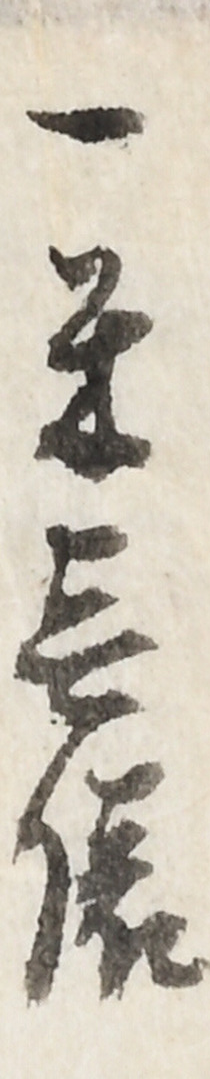一米壱俵
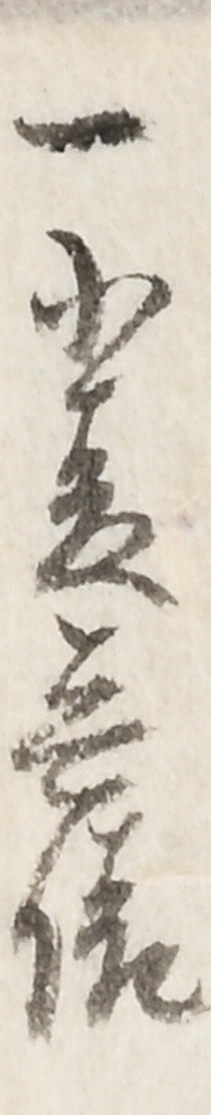一小麦壱俵

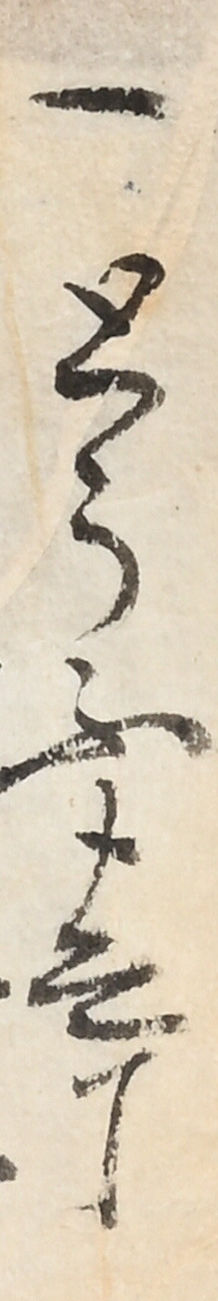一とうふ壱丁
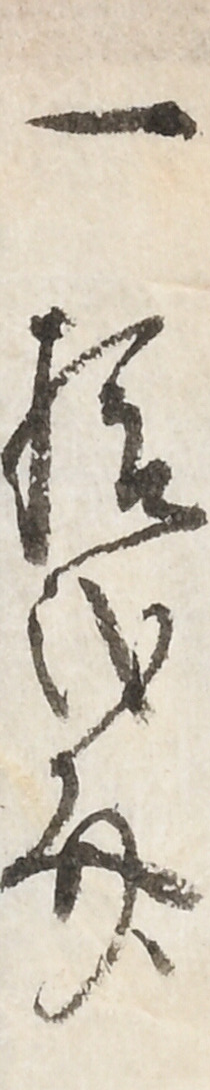一拾弐文
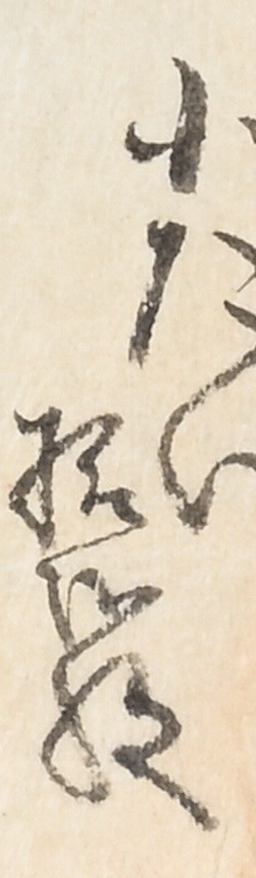拾弐枚
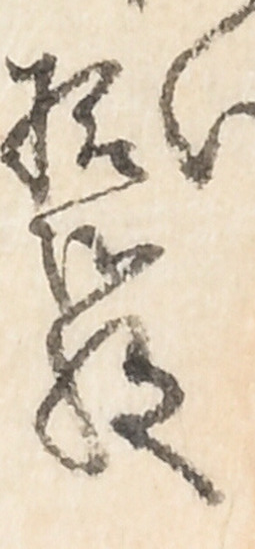拾弐枚
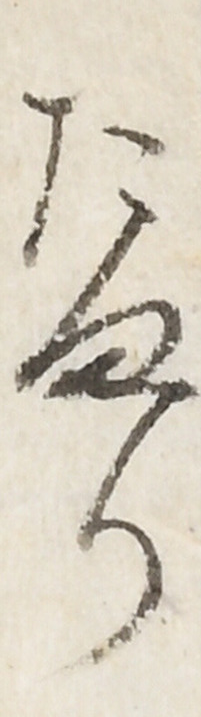たまり
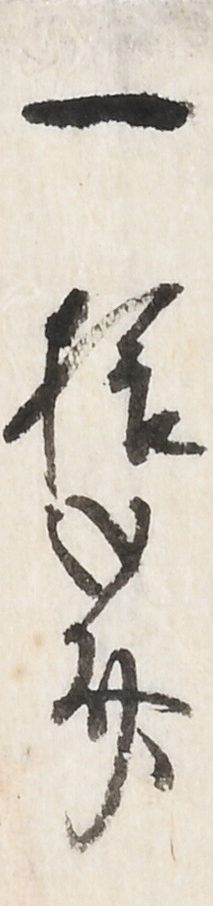一拾弐文
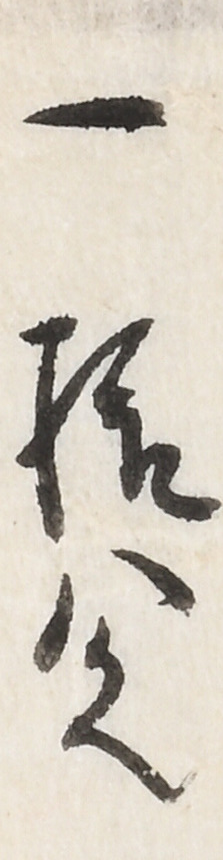一拾弐文
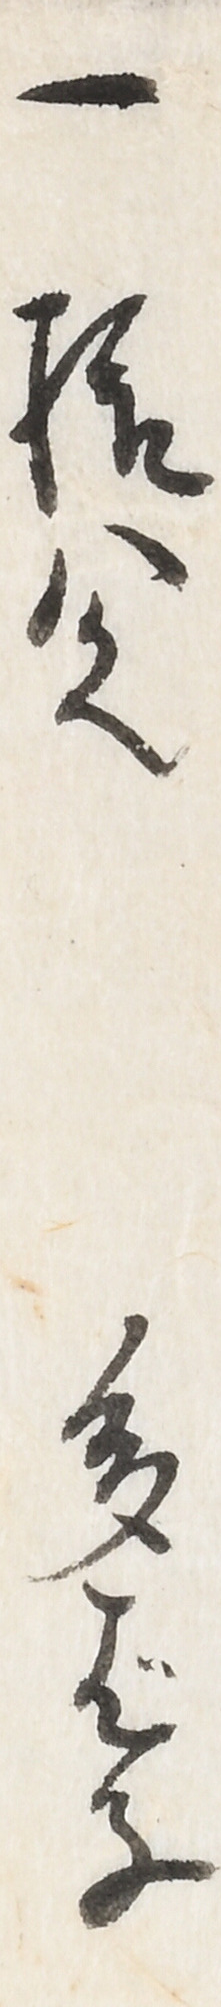一拾八文たばこ
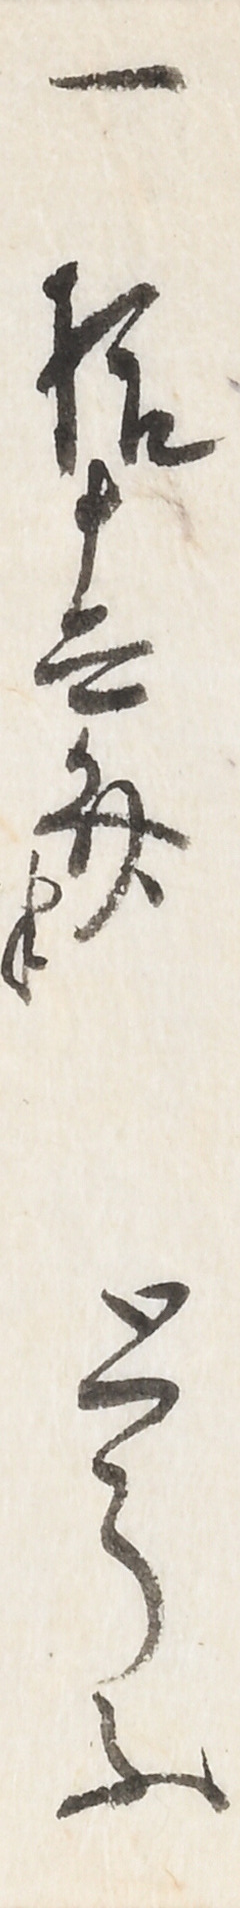一拾壱文半とうふ
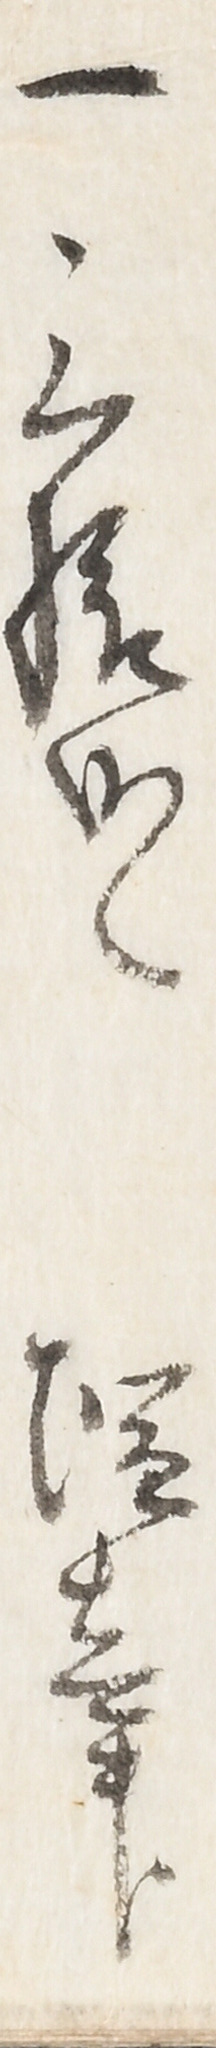一三拾弐文塩壱升
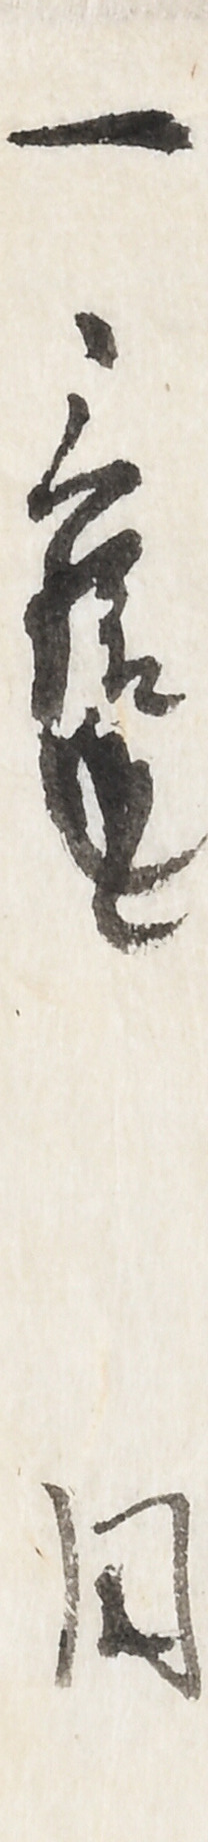一三拾文同
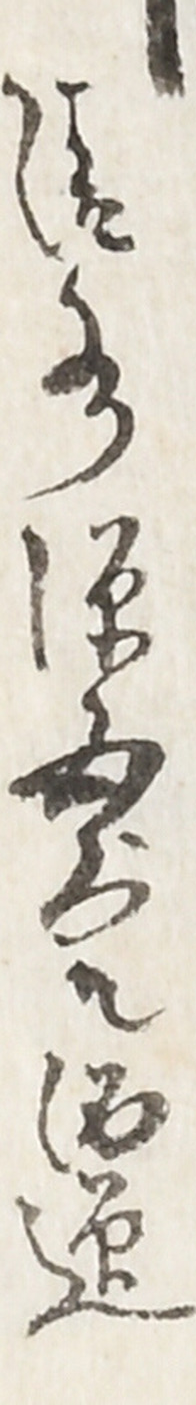清水源五郎殿酒迎
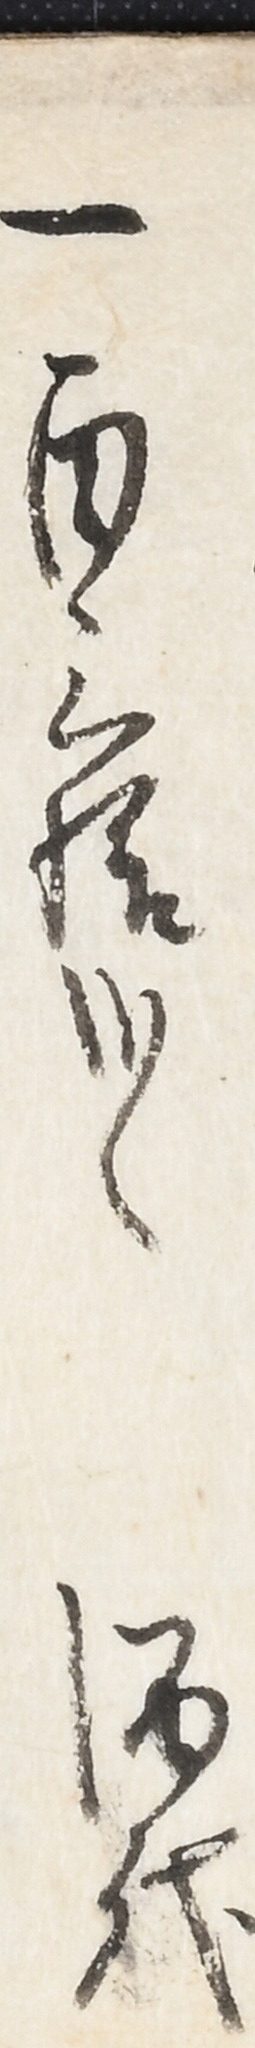一百三拾弐文酒代
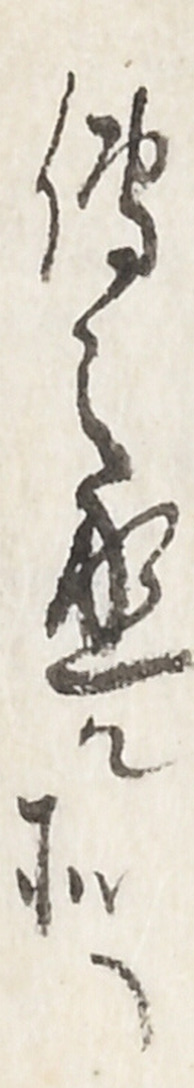伝之丞殿所へ
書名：合力覚帳
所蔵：伊那市立高遠町図書館・合同会社AMANE
